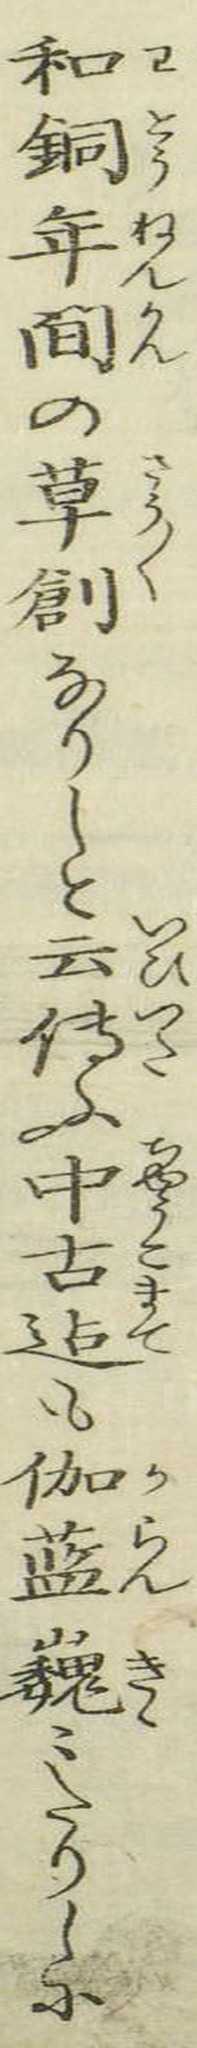和銅年間の草創なりしと云伝ふ中古迄も伽藍巍々たりしに
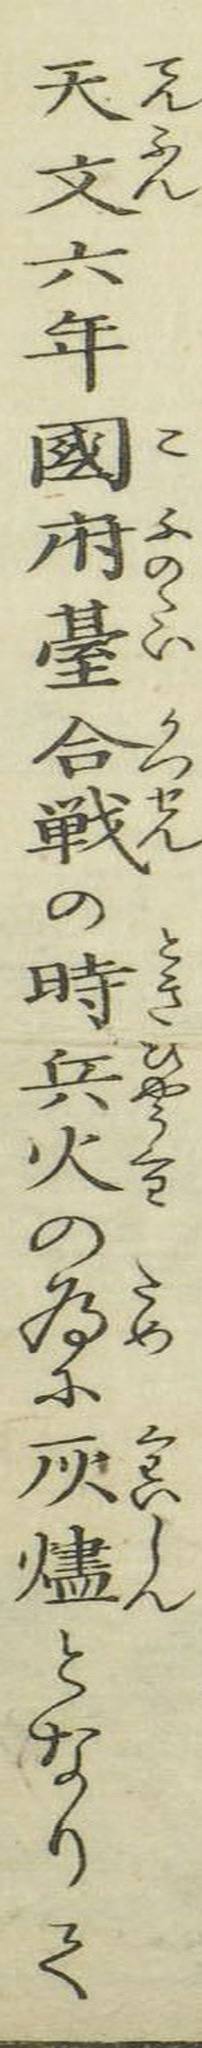天文六年国府台合戦の時兵火の為に灰燼となりて

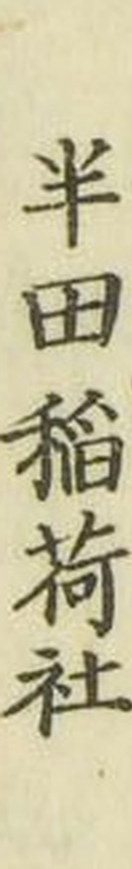半田稲荷社
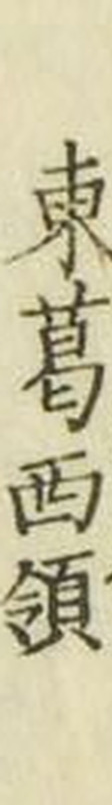東葛西領
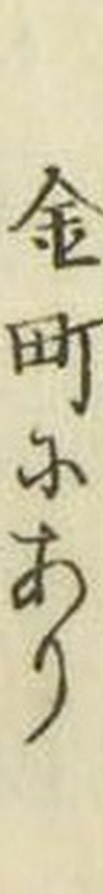金町にあり
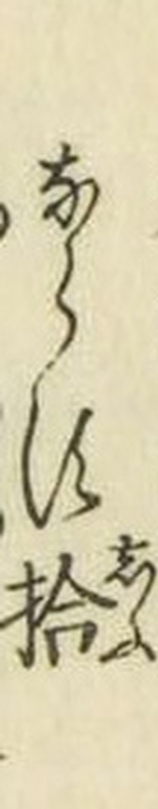ならす拾

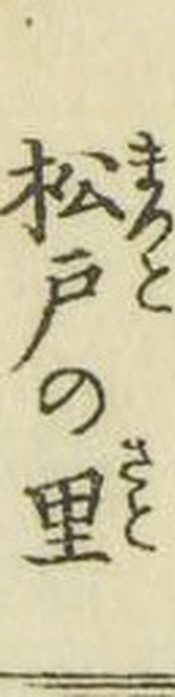松戸の里
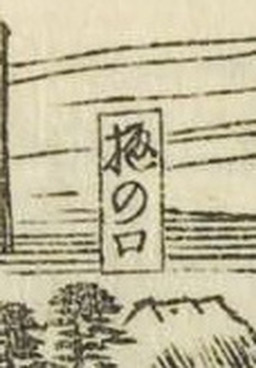樋の口

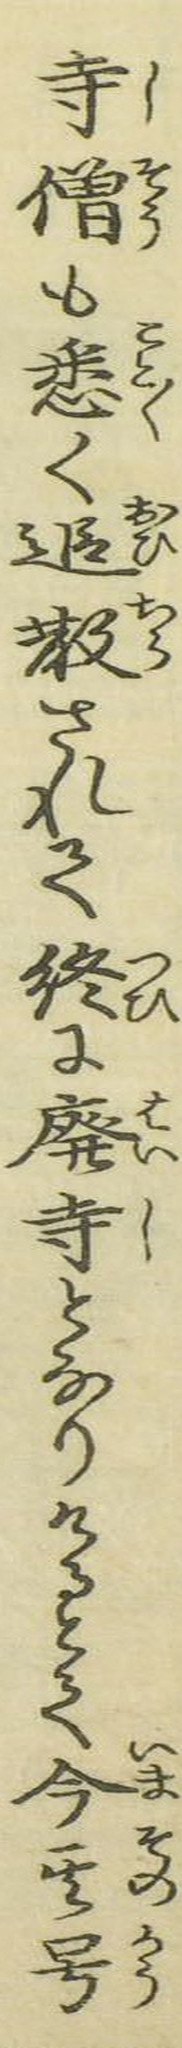寺僧も悉く追散されて終に廃寺ちなりけるとて今其号
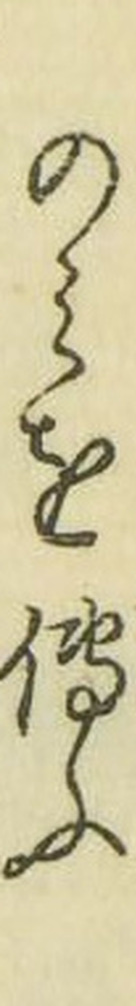のみを伝ふ
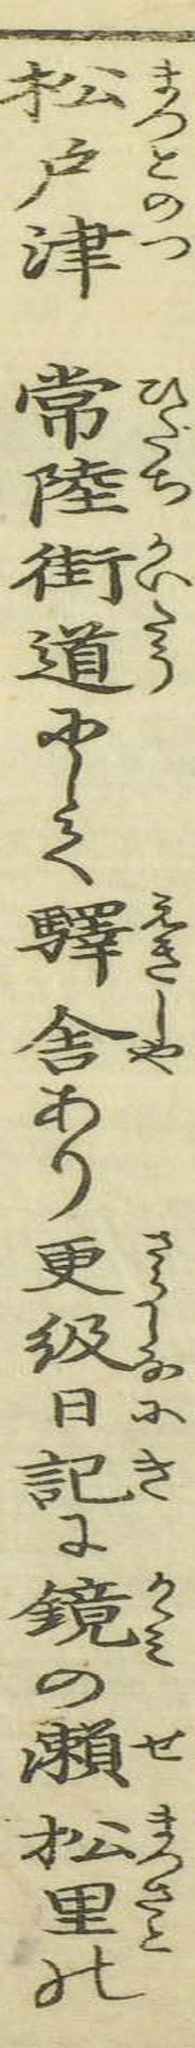松戸津常陸街道にして駅舎あり更級日記に鏡の瀬松里の
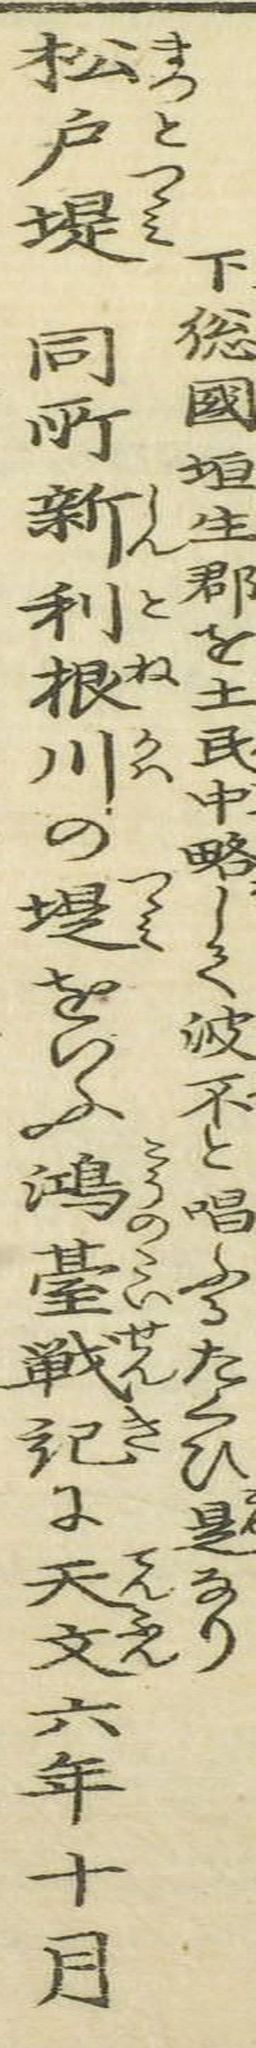松戸堤同所新利根川の堤をいふ鴻台戦記に天文六年十月
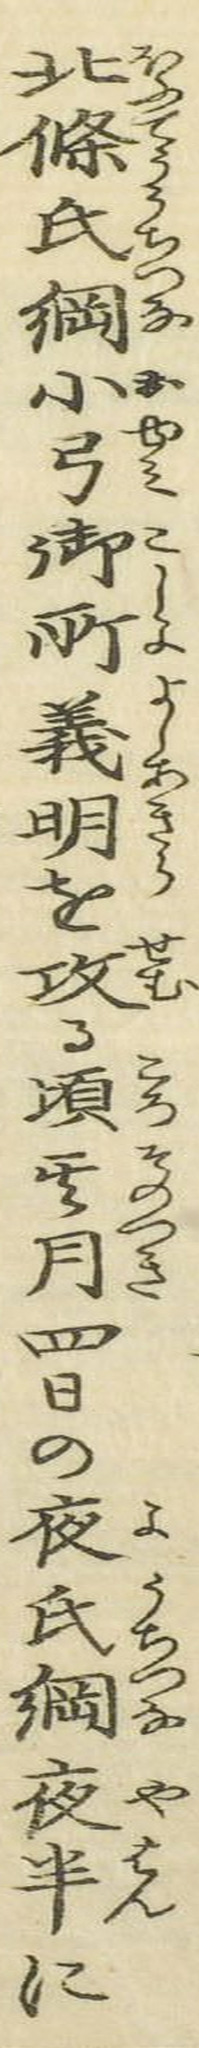北条氏綱小弓御所義明を攻る頃其月四日の夜氏綱夜半に
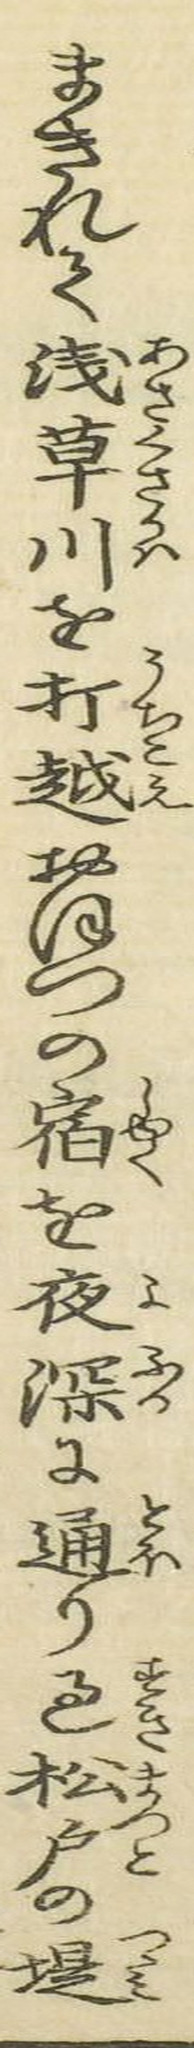まきれて浅草川を打越おほつの宿を夜深に通り過松戸の堤
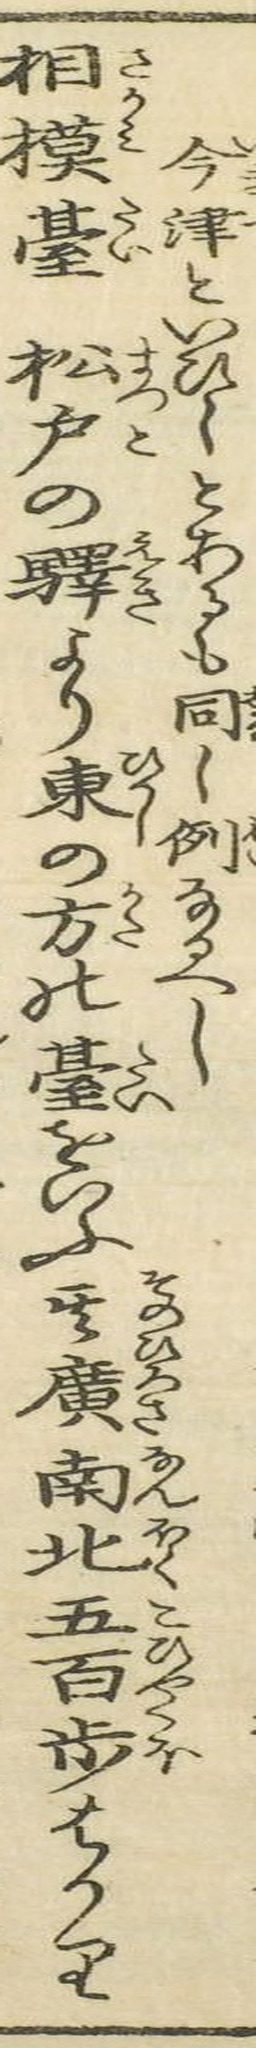相模台松戸の駅より東の方の台をいふ其広南北五百歩はかり
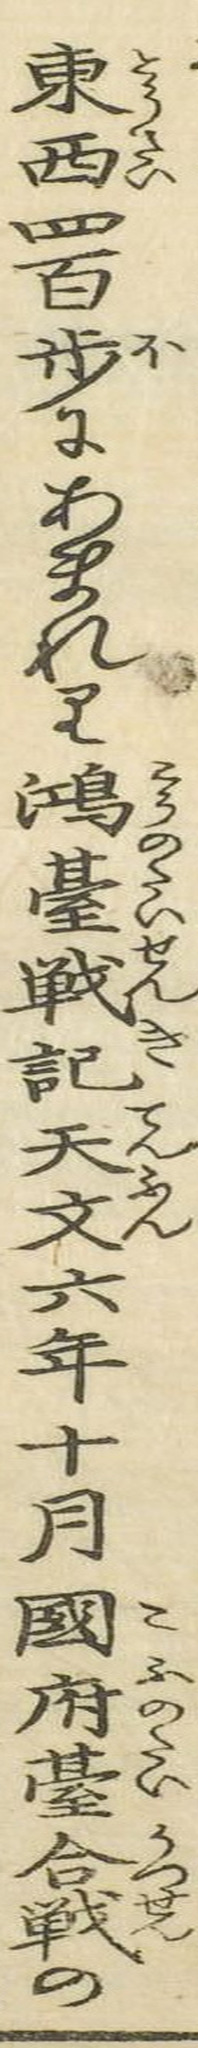東西四百歩にあまれり鴻台戦記天文六年十月国府台合戦の
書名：江戸名所図会 20巻 巻之20
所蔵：東京学芸大学教育コンテンツアーカイブ
